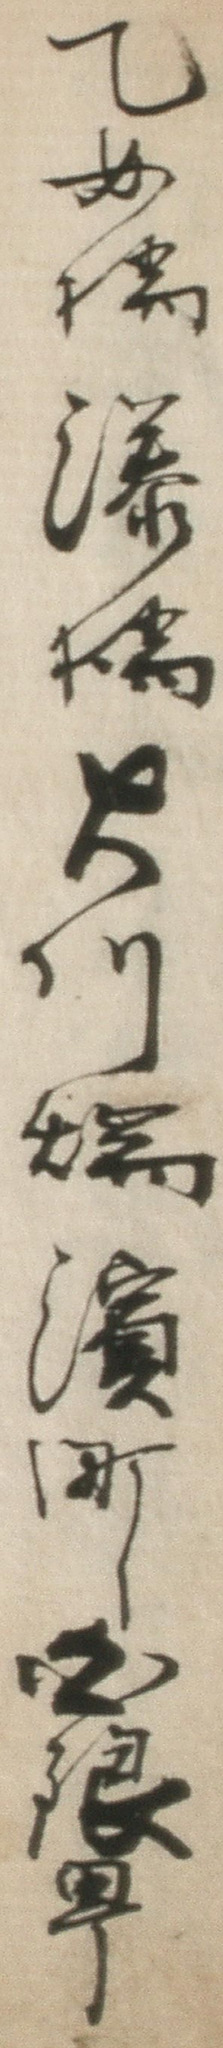乙女橋湊橋大川端浜町白銀町
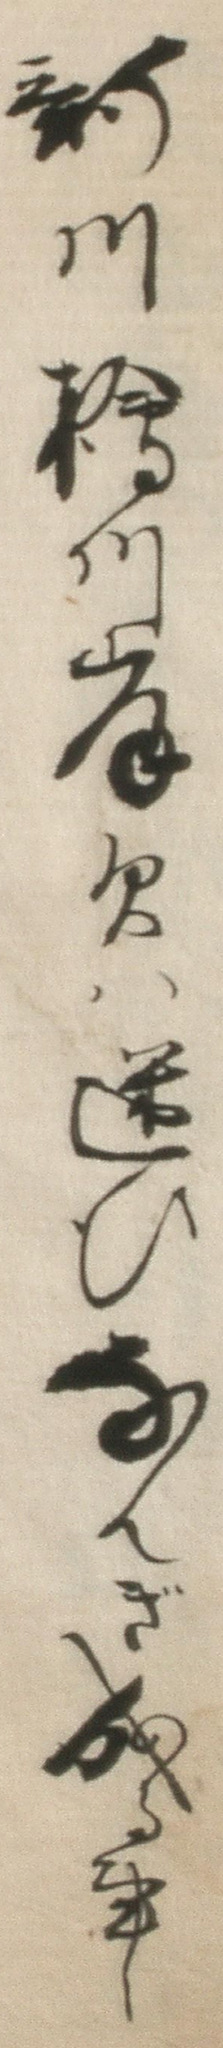新川檜川岸欠ハ迷ひなんぎ成る事
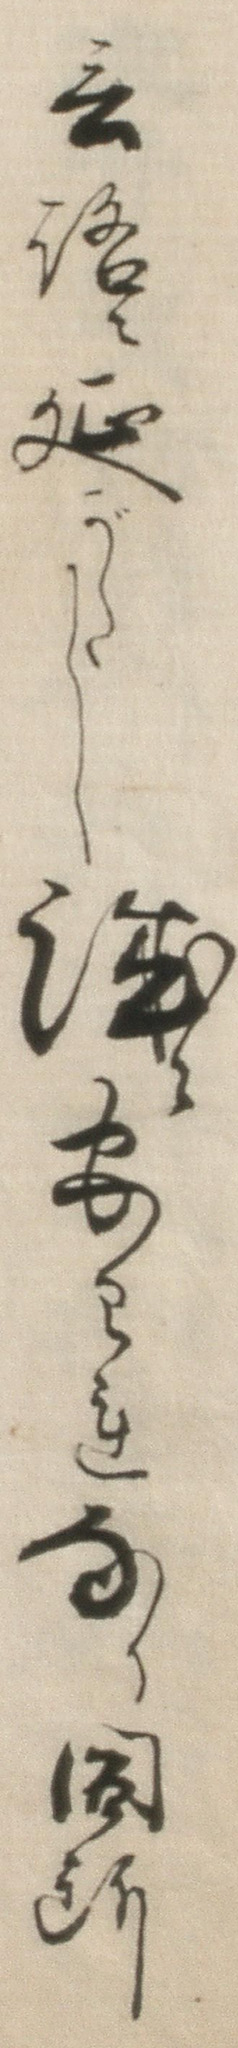言語二延がたし誠二あわれなり同断
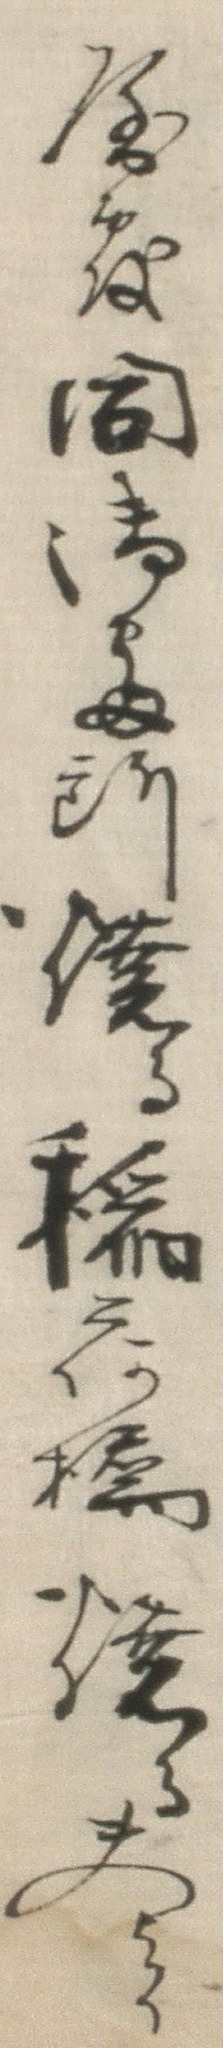屋敷同御番所焼る稲荷橋焼る夫より
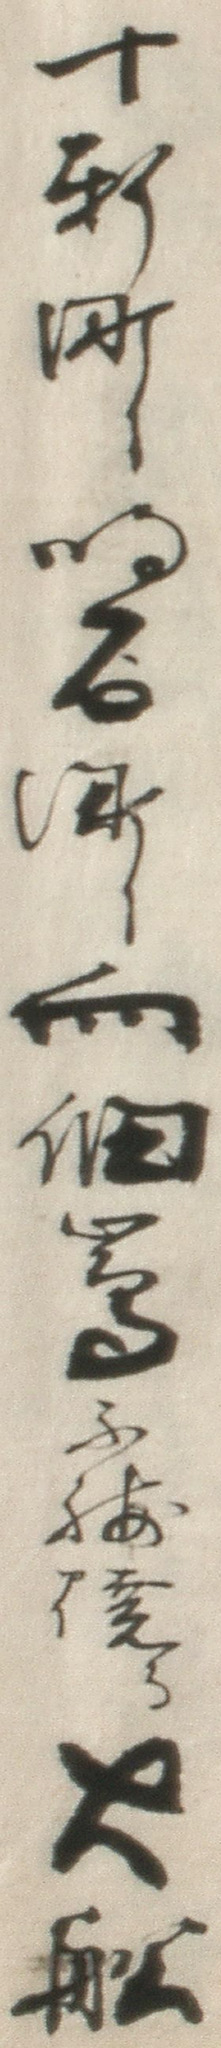十軒町明石町向佃嶌不残焼る大船
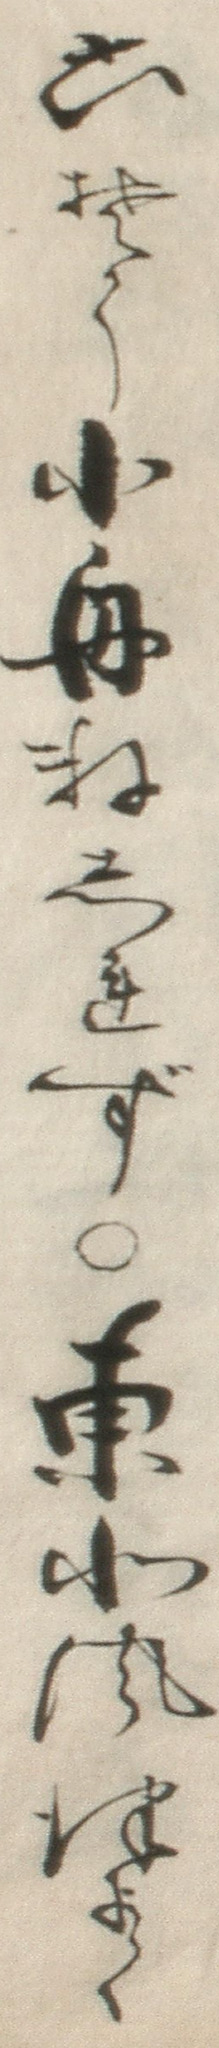六そう小舟数しれず〇東北風つよく
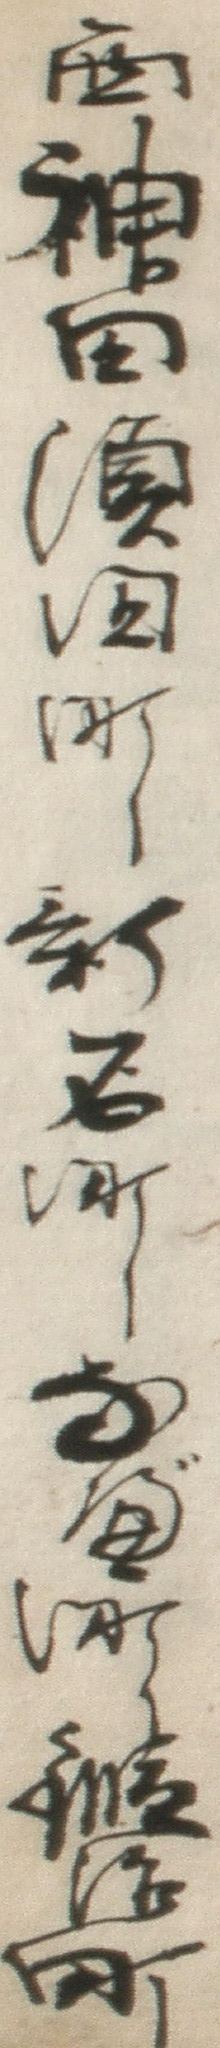西神田須田町新石町なべ町鍛冶町
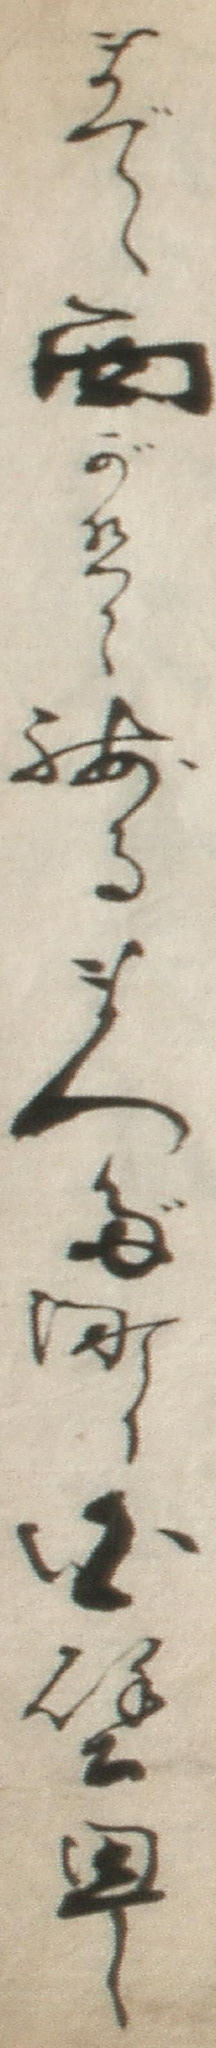まで西がは残るまへだ町白壁町

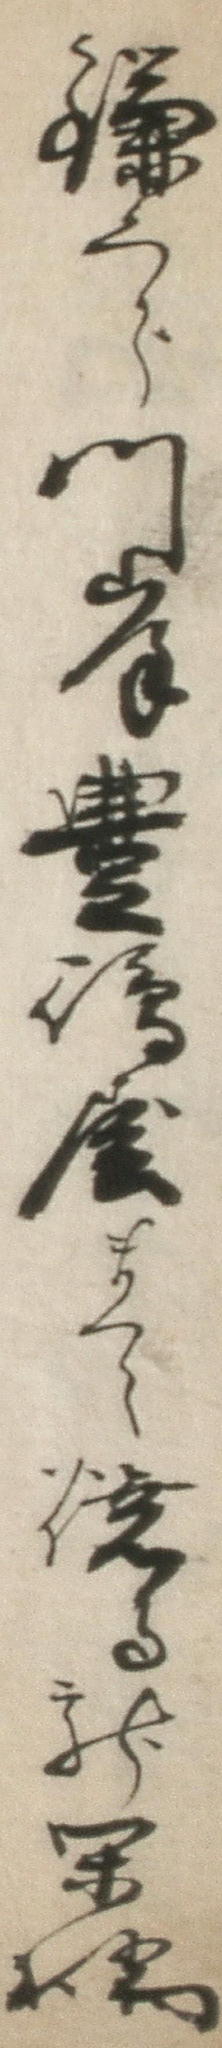鎌くら川岸豊嶋屋まで焼る龍閑橋
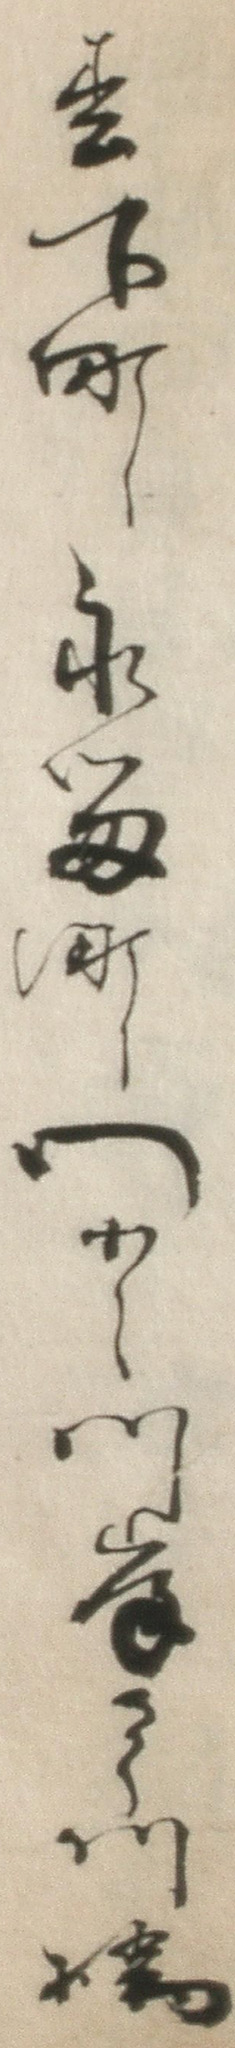松下町永留町門少々川岸さう川橋
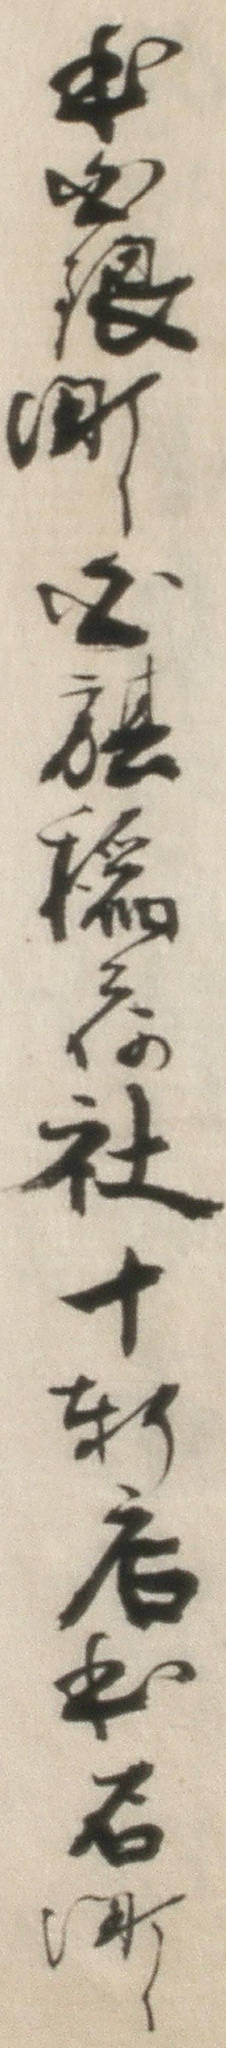本白銀町白旗稲荷社十軒店本石町
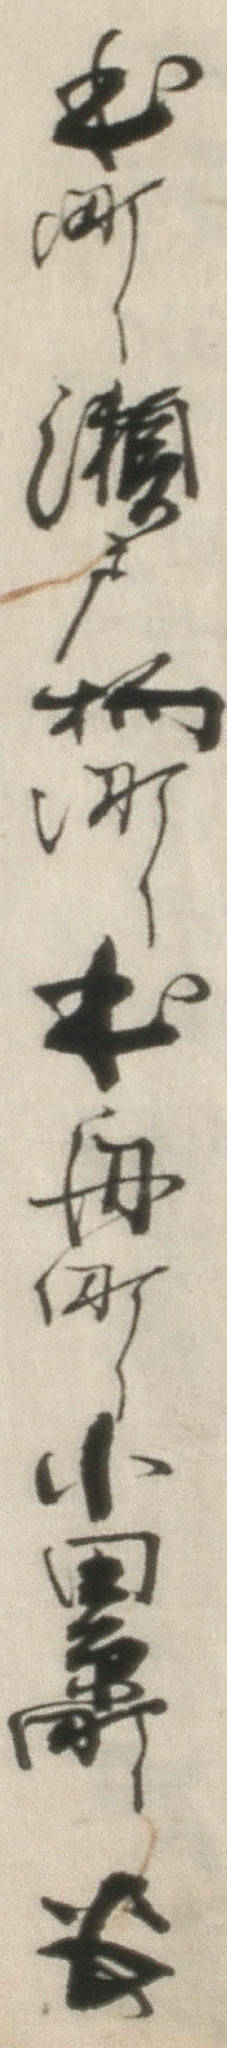本町瀬戸物町本舟町小田原町安
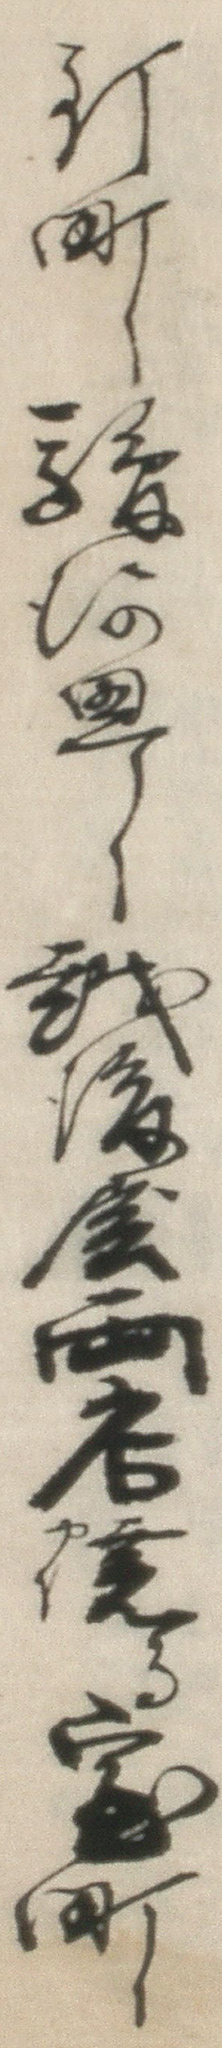針町駿河町越後屋両店焼る室町
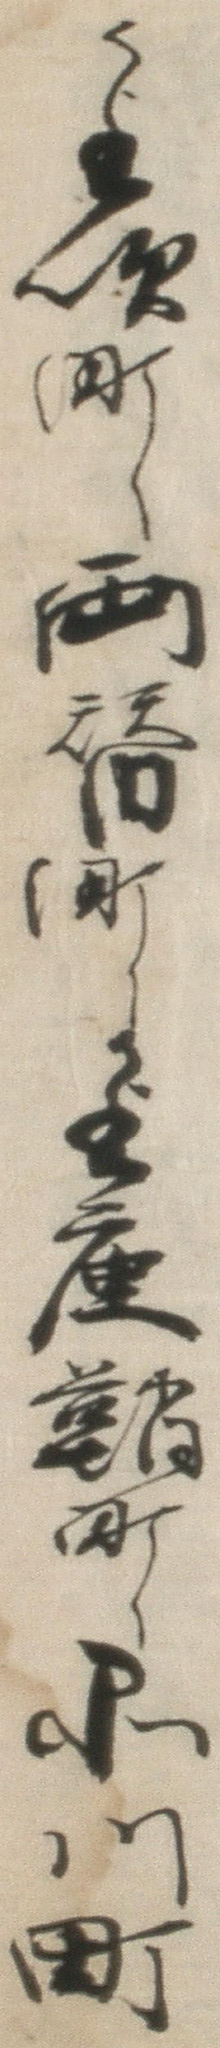金吹町両替町金座鞘町品川町
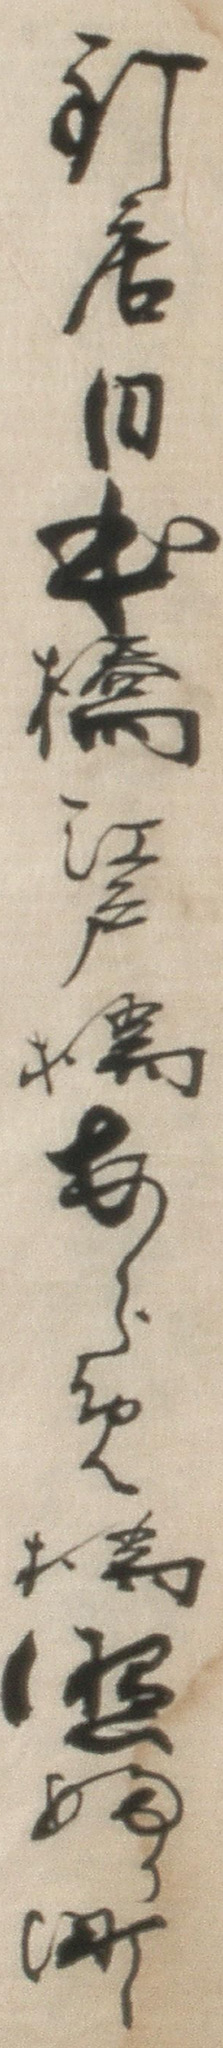釘店日本橋江戸橋あらめ橋照ふり町
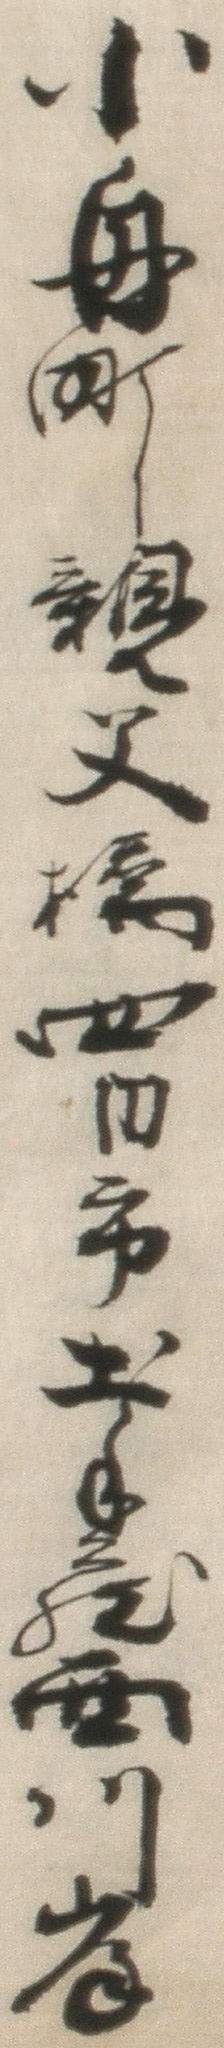小舟町親父橋四日市土手蔵西川岸
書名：文政十二丑としの類焼場所附
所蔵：東京大学地震研究所図書室 Earthquake Research Institute Library, The University of Tokyo, JAPAN
